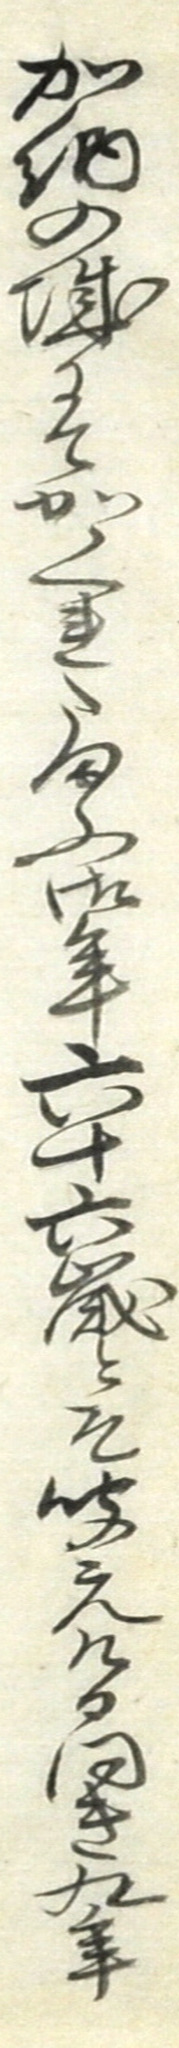加納の城にてかくれたまふ御年六十六歳とそ聞えける同き九年
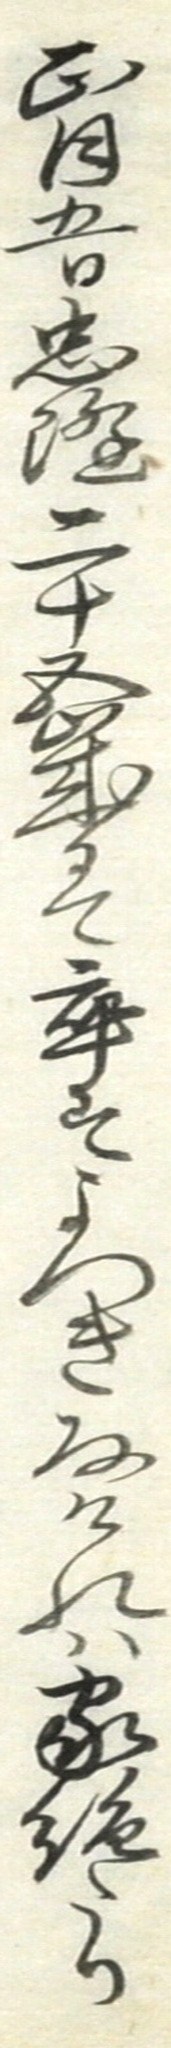正月五日忠隆二十五歳にて卒すよつきなけれは家絶たり
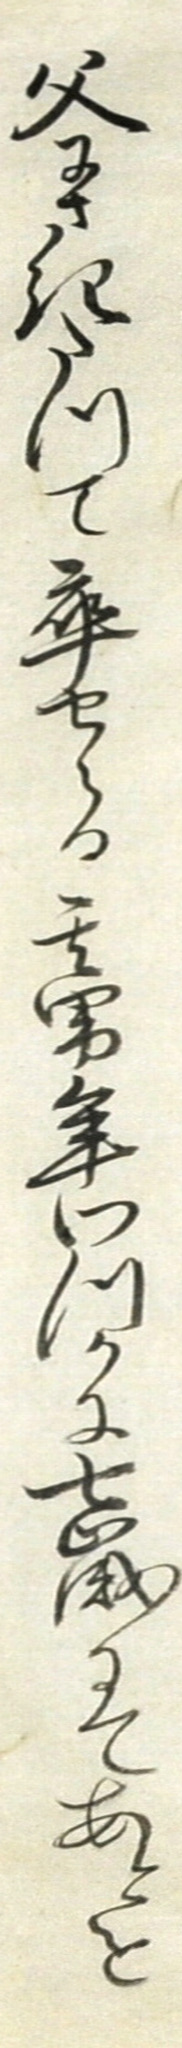父にさきたつて卒せらる其男年わつかに七歳にてあとを
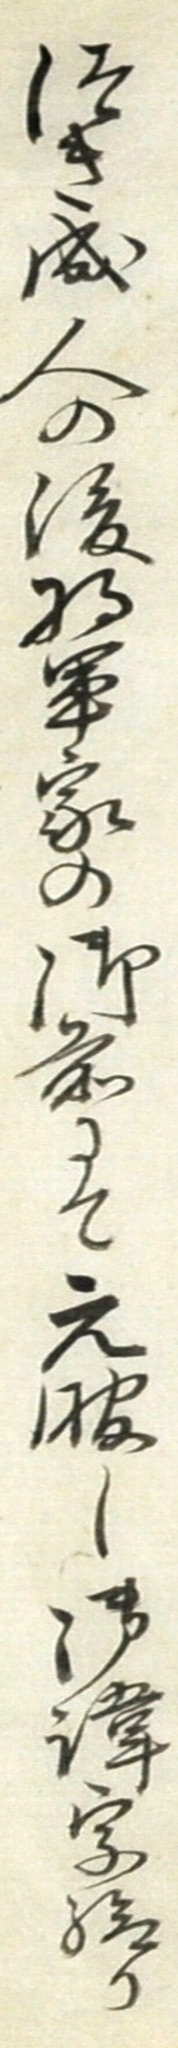つき成人の後将軍家の御前にて元服し御諱字給り
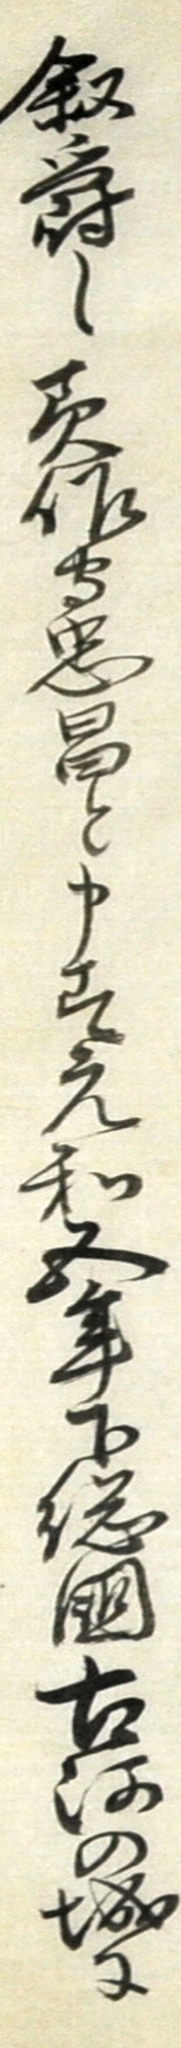叙爵し美作守忠昌と申す元和五年下総国古河の城に

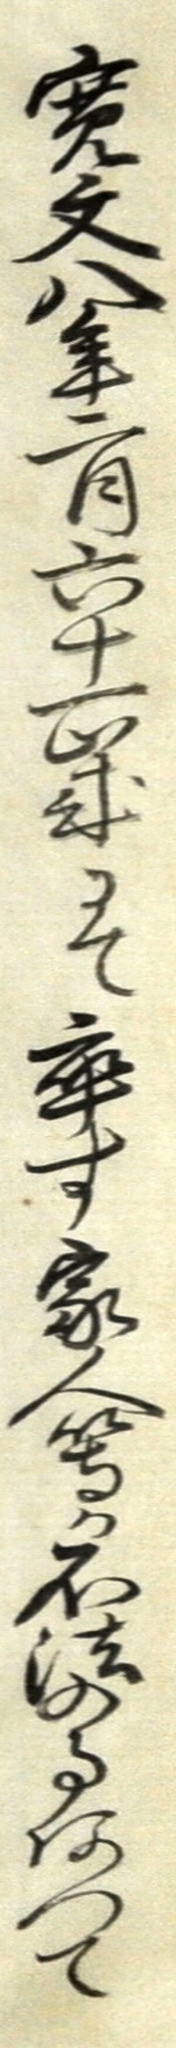寛文八年二月六十一歳にて卒す家人等か不法の事あつて
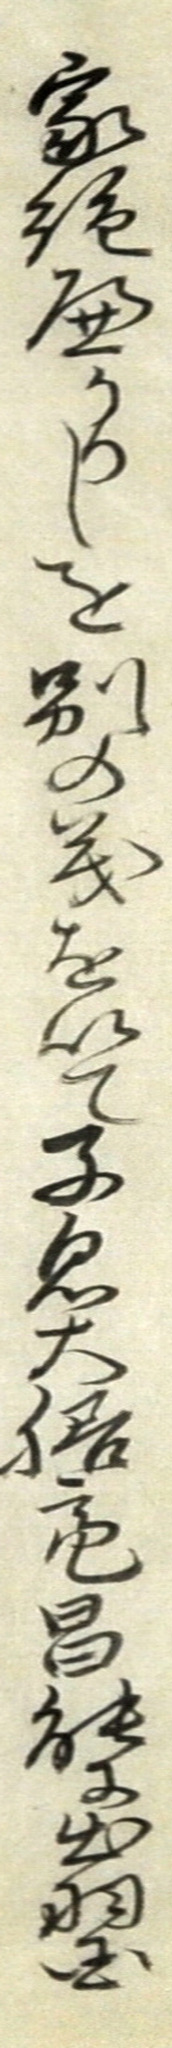家絶へかりしを別の義を以て子息大膳亮昌能に出羽国
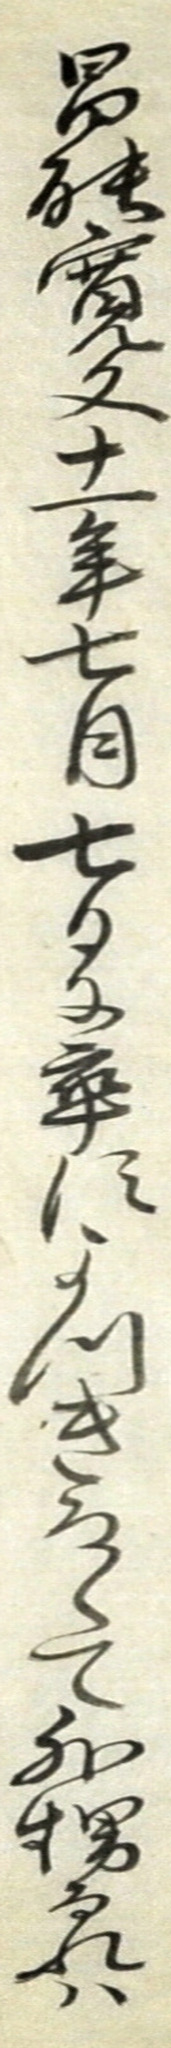昌能寛文十一年七月七日に卒すよつきなくて外甥なれは
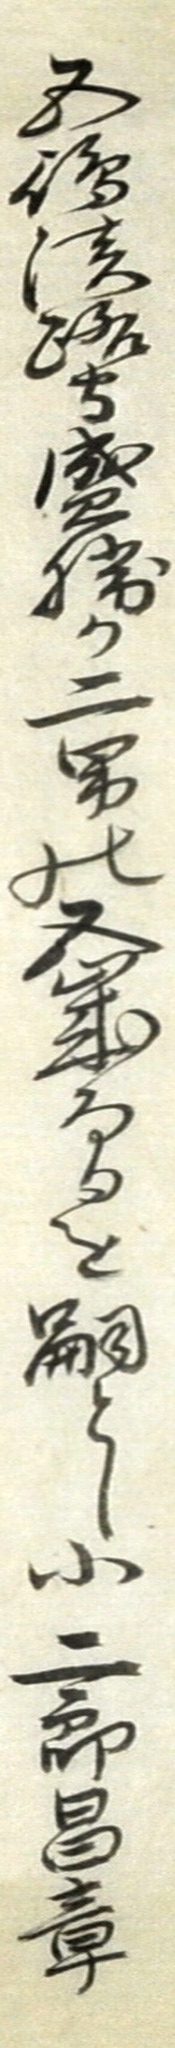五島淡路守盛勝か二男の五歳なるを嗣とし小二郎昌章
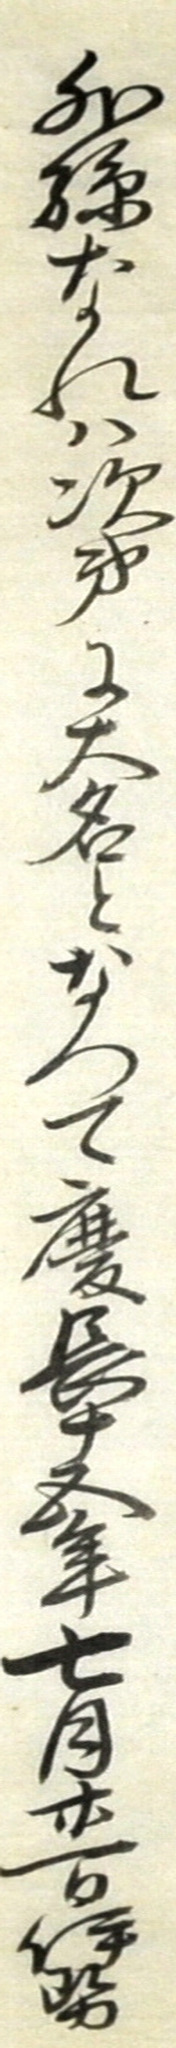外孫なれは次第に大名となつて慶長十五年七月廿一日伊勢
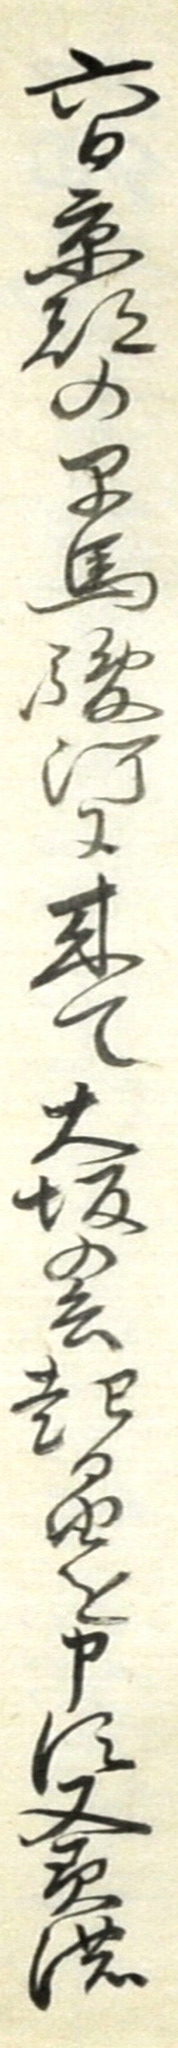六日京都の早馬駿河に来て大坂の兵起る由を申す又美濃
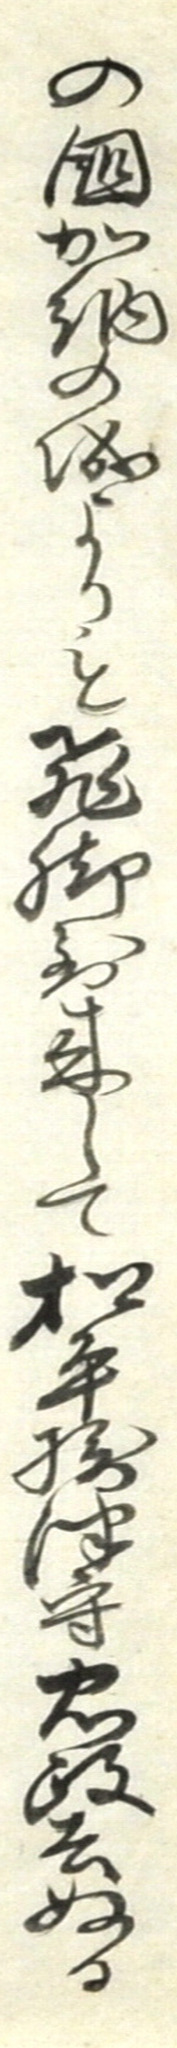の国加納の城よりも飛脚到来して松平摂津守忠政去ぬる
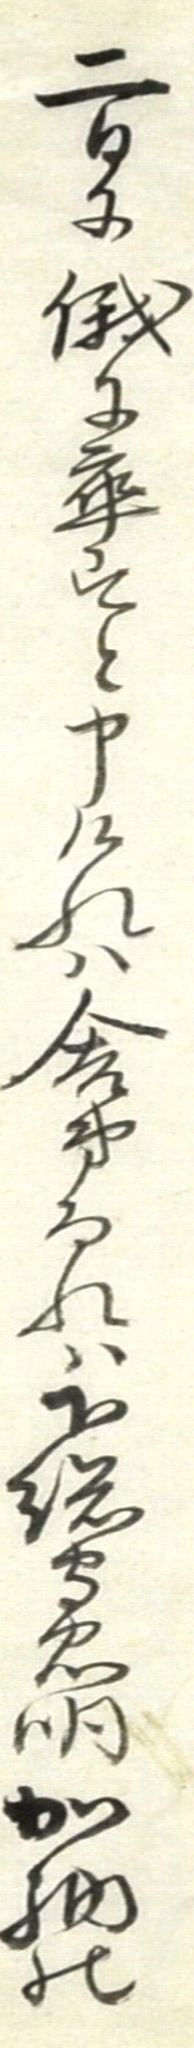二日に俄に卒すと申けれは舎弟なれは下総守忠明加納の
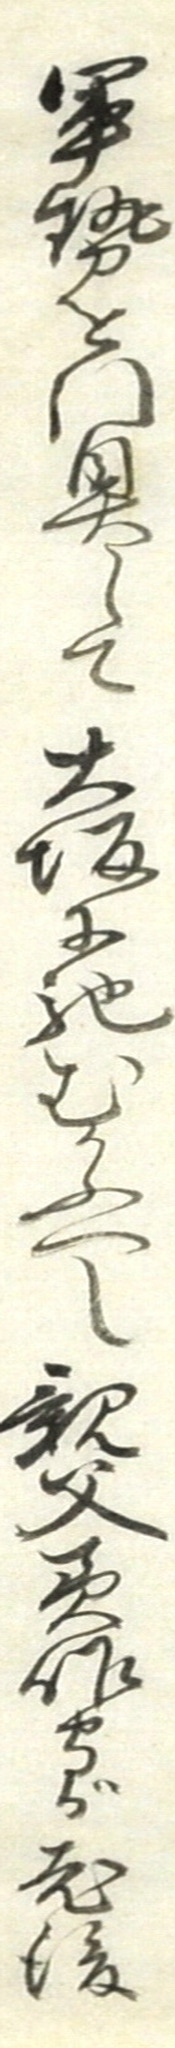軍勢を引具して大坂に馳むかふへし親父美作守が老後
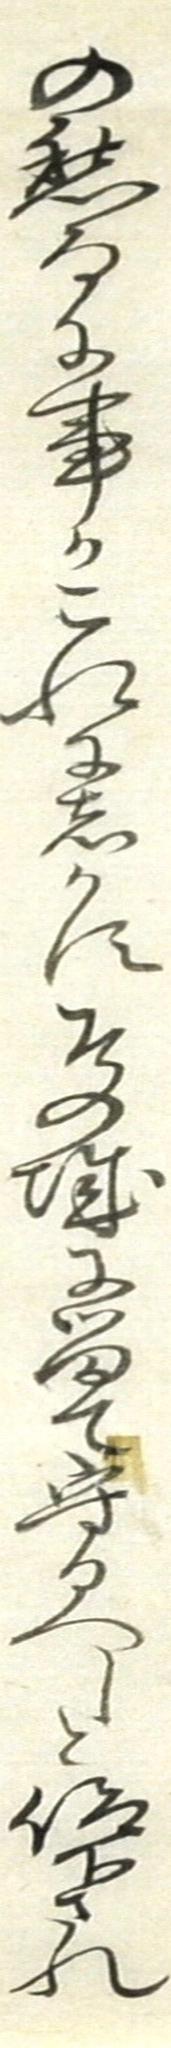の愁なに事かこれにしかすその城に留て守るへしと仰下され
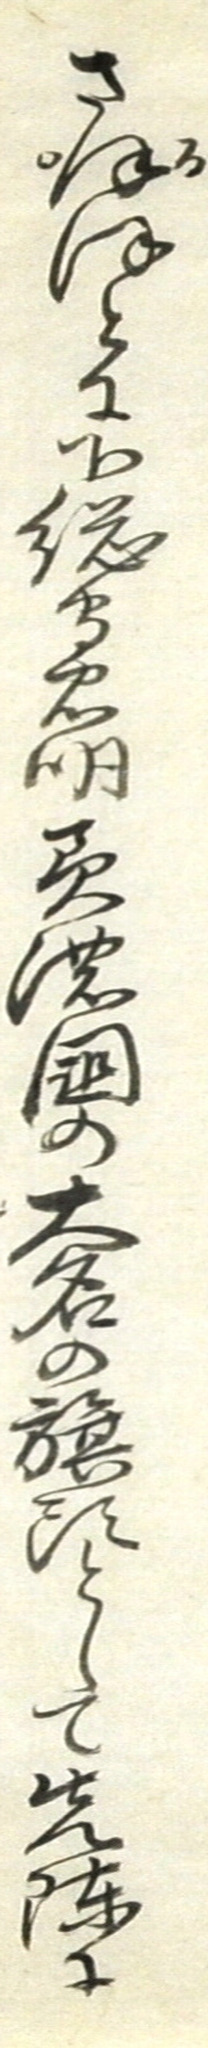さほほとに下総守忠明美濃国の大名の旗頭として先陣に
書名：藩翰譜（六）
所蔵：伊那市立高遠町図書館・合同会社AMANE
